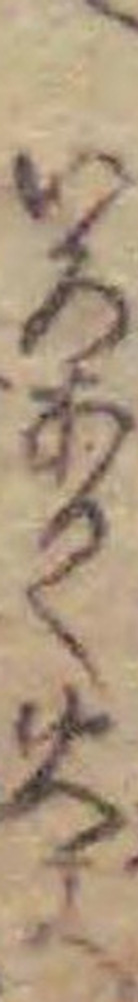いろあかく火に
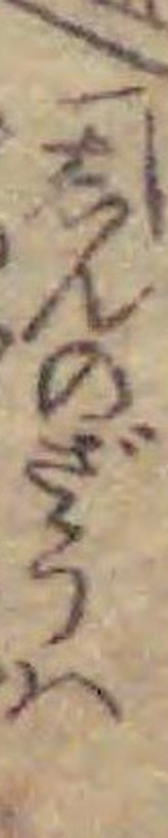〽しんのざうは
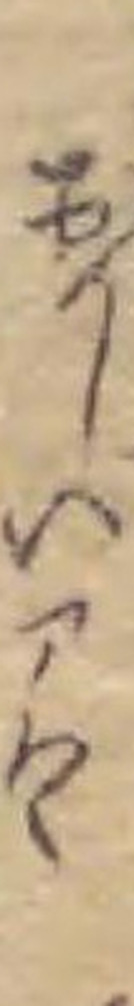おかしいアハヽ
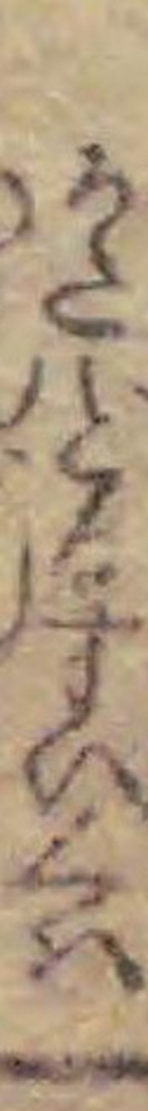かたどるすいくは
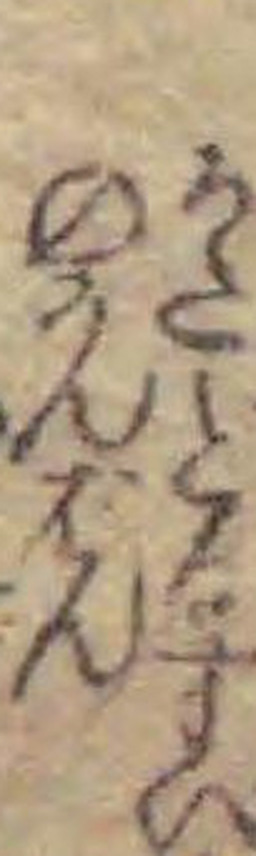のかんばん
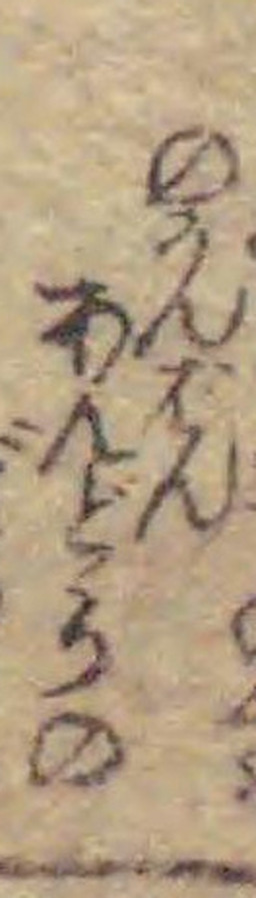あんどうの
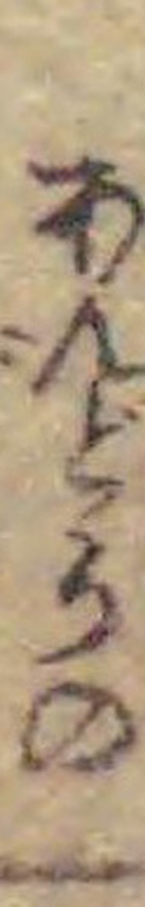あんどうの
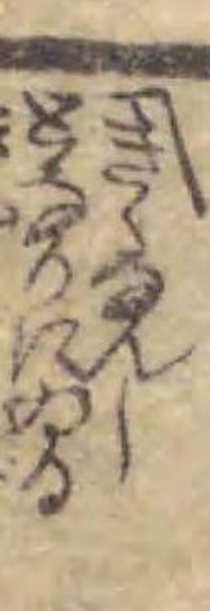となりにゐる
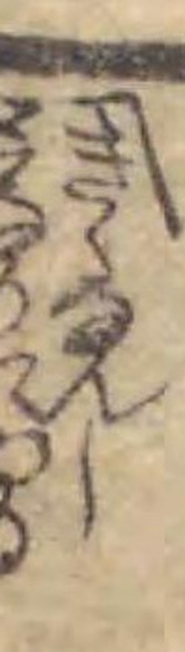〽きくなんし
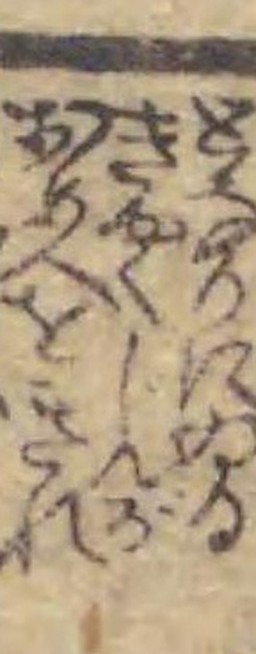おめへをきれ
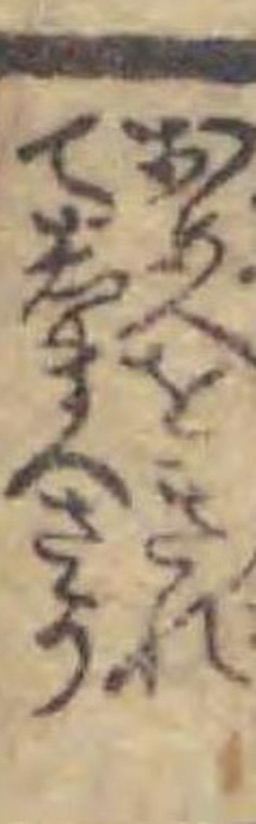てしまへさう
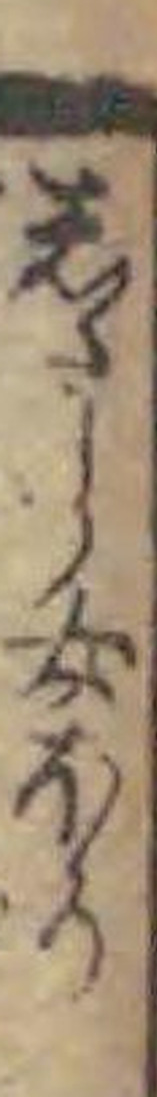したら女ほう
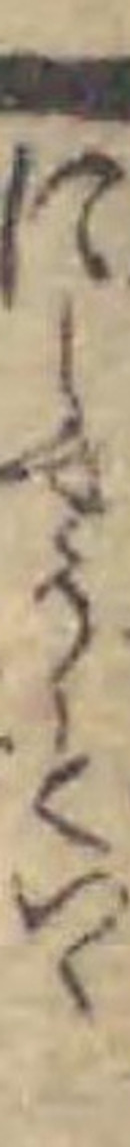にしやうといゝ
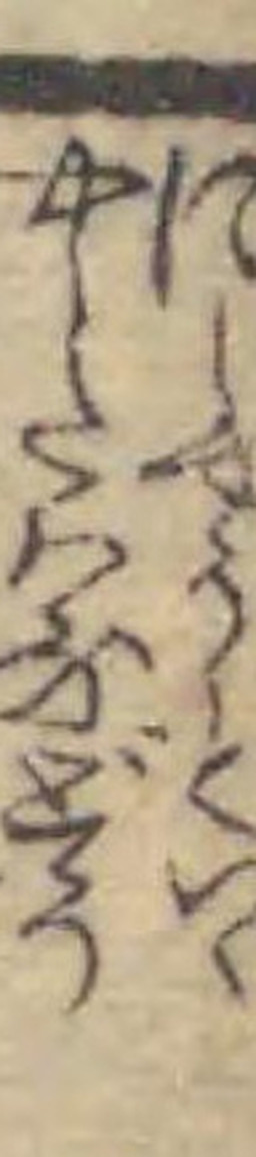やしたはなどう
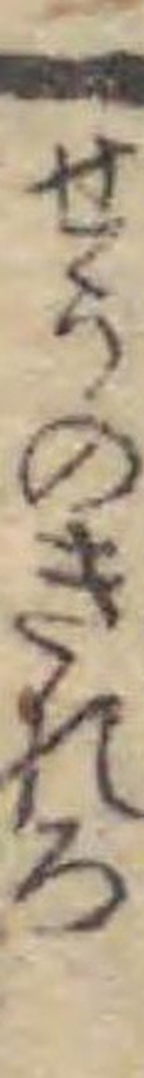せうのきれろも
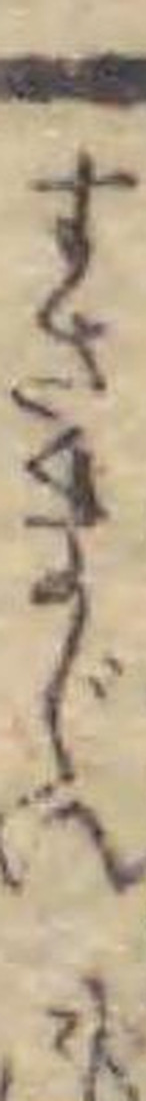すさまじい
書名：十四傾城腹之内 : 3巻
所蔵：国立国会図書館 National Diet Library, JAPAN
